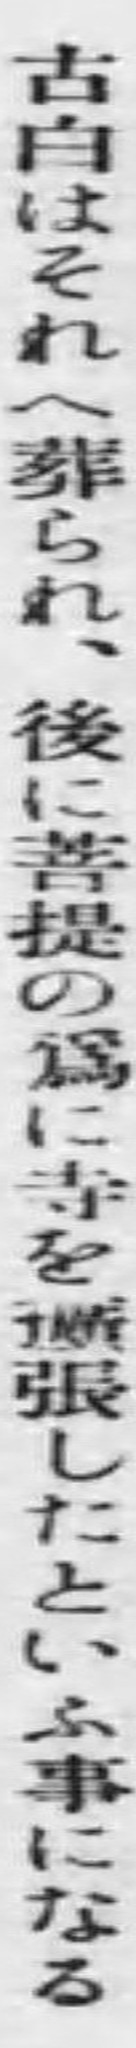古白はそれへ葬られ、後に菩提の為に寺を拡張したといふ事になる
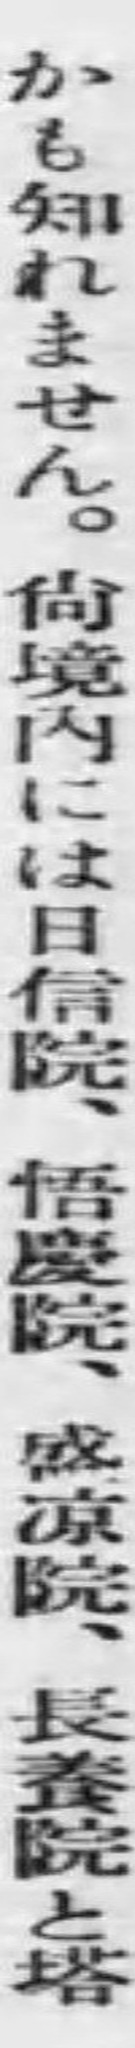かも知れません。尚境内には日信院、悟慶院、盛涼院、長養院と塔
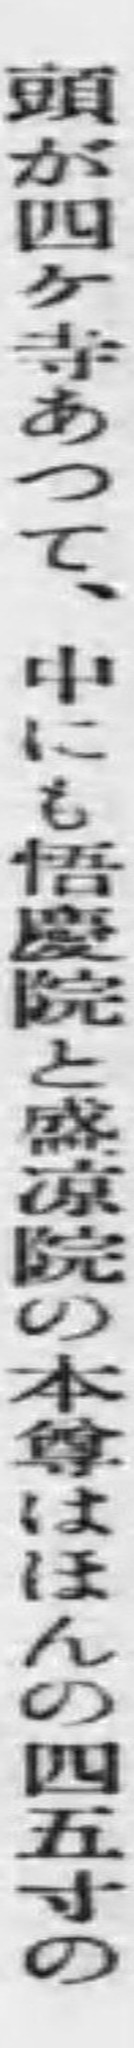頭が四ヶ寺あつて、中にも悟慶院と盛涼院の本尊はほんの四五寸の
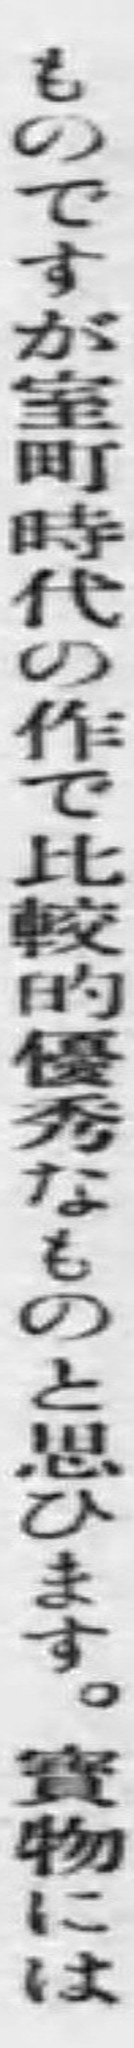ものですが室町時代の作で比較的優秀なものと思ひます。宝物には
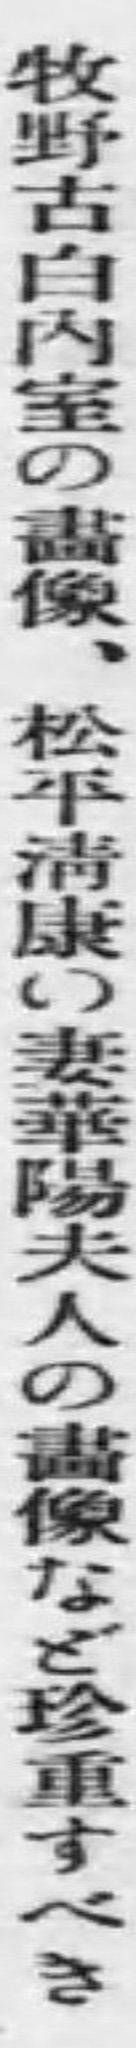牧野古白内室の画像、松平清康の妻華陽夫人の画像など珍重すべき
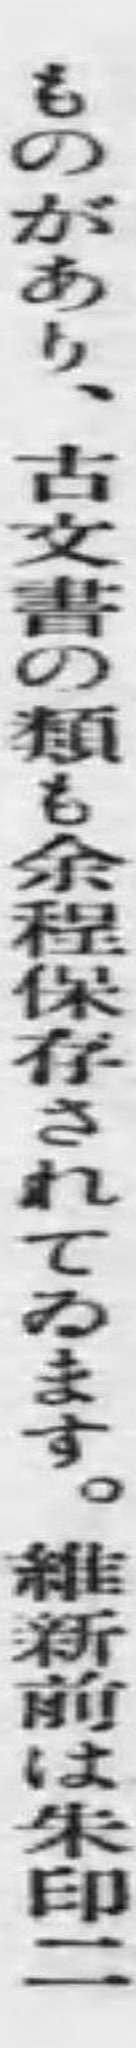ものがあり、古文書の類も余程保存されてゐます。維新前は朱印二
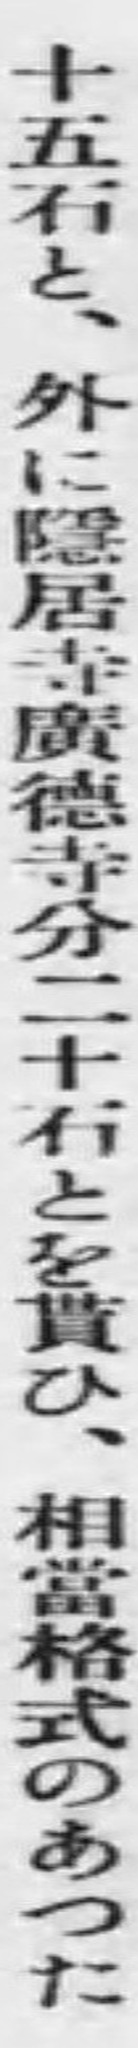十五石と、外に隠居寺広徳寺分二十石とを貰ひ、相当格式のあつた
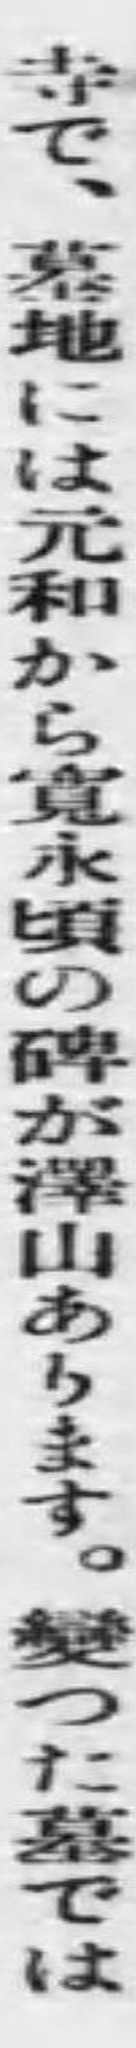寺で、墓地には元和から寛永頃の碑が沢山あります。変つた墓では
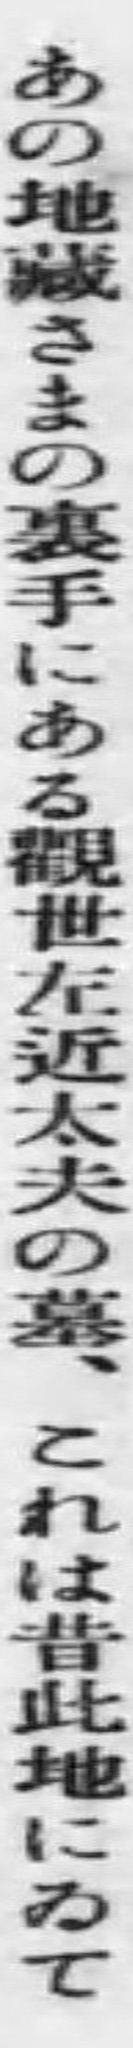あの地蔵さまの裏手にある観世左近太夫の墓、これは昔此地にゐて
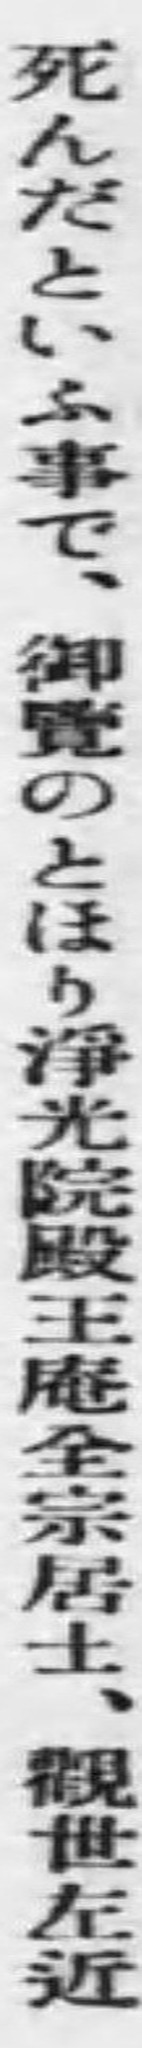死んだといふ事で、御覧のとほり浄光院殿王庵全宗居土、観世左近

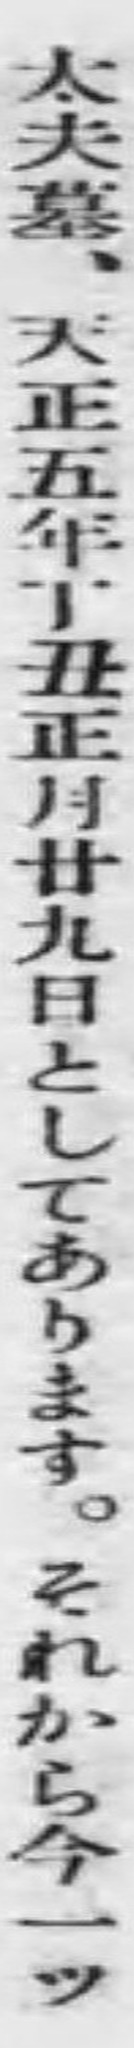太夫墓、天正五年丁丑正月廿九日としてあります。それから今一ッ
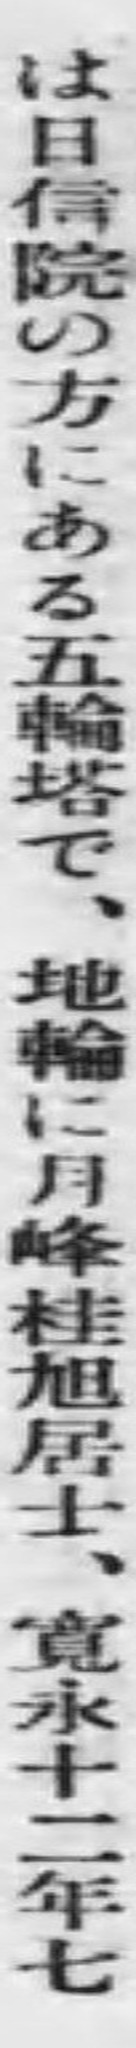は日信院の方にある五輪塔で、地輪に月峰桂旭居士、寛永十二年七
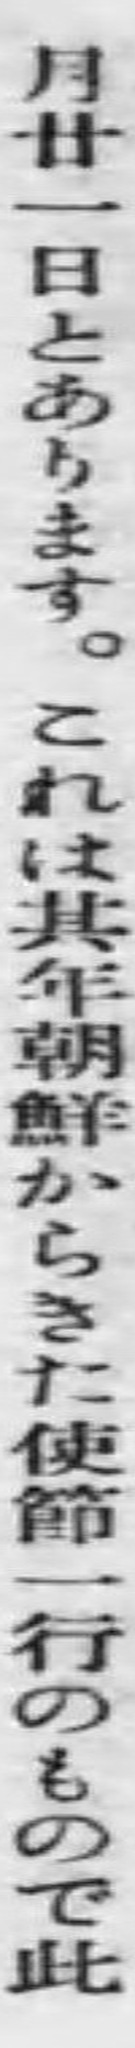月廿一日とあります。これは其年朝鮮からきた使節一行のもので此
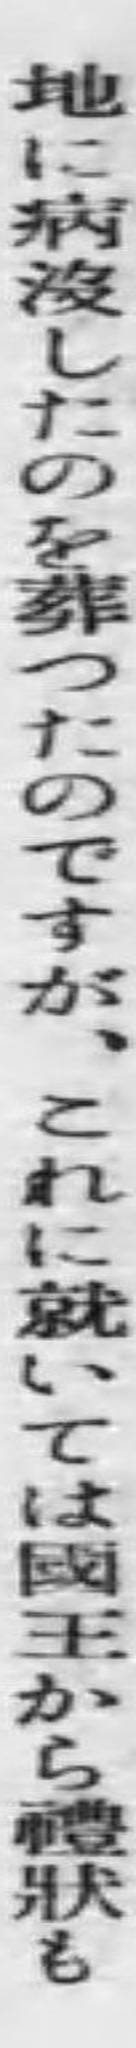地に病没したのを葬つたのですが、これに就いては国王から礼状も
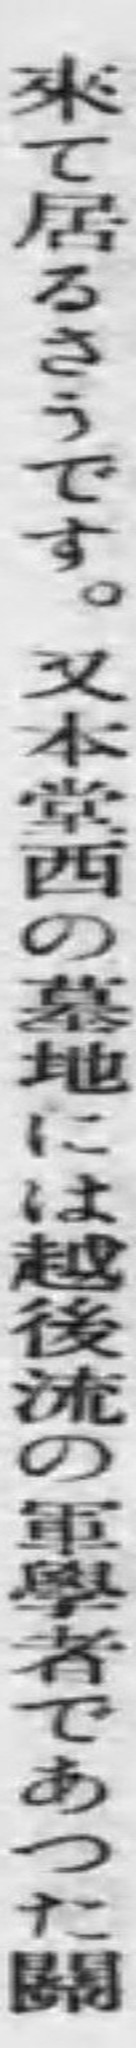来て居るさうです。又本堂西の墓地には越後流の軍学者であつた関
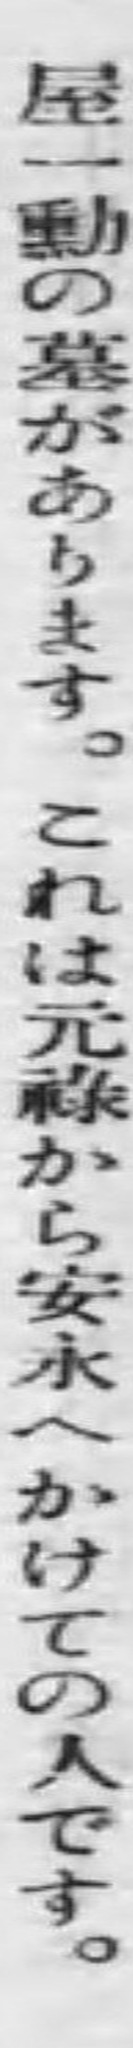屋一勲の墓があります。これは元禄から安永へかけての人です。
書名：東三河道中記 : 豊橋市及其附近案内
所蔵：国立国会図書館 National Diet Library, JAPAN
